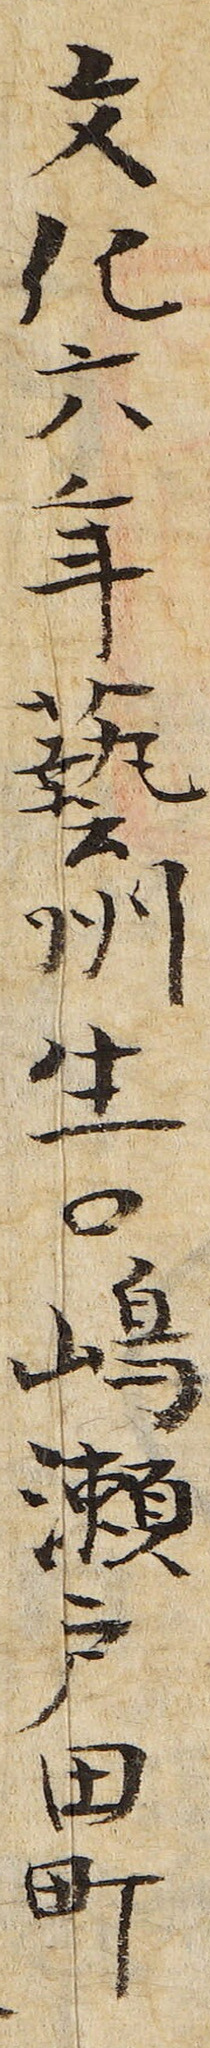文化六年藝州生口嶋瀬戸田町

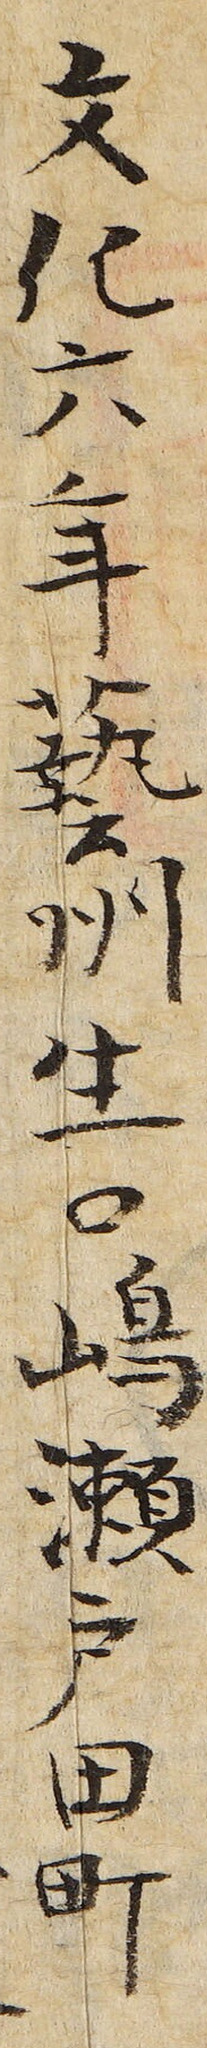文化六年藝州生口嶋瀬戸田町

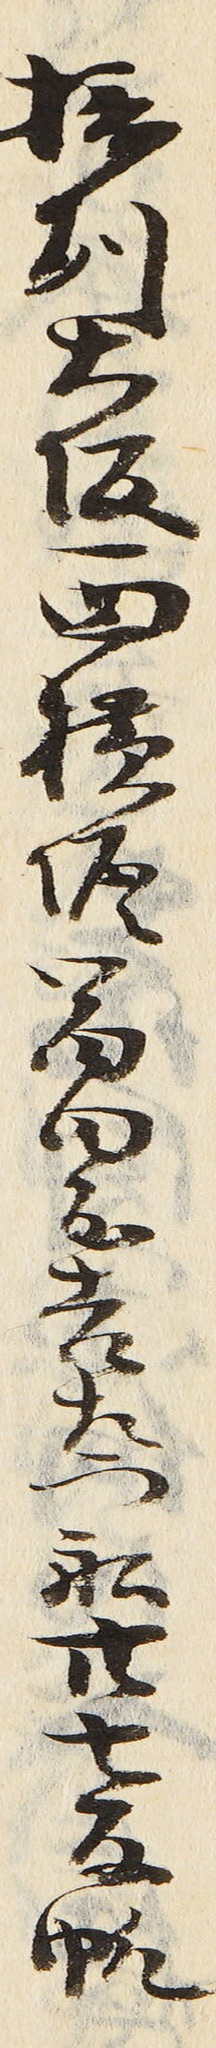摂州大坂西横堀冨田屋吉左衛門船廿七反帆
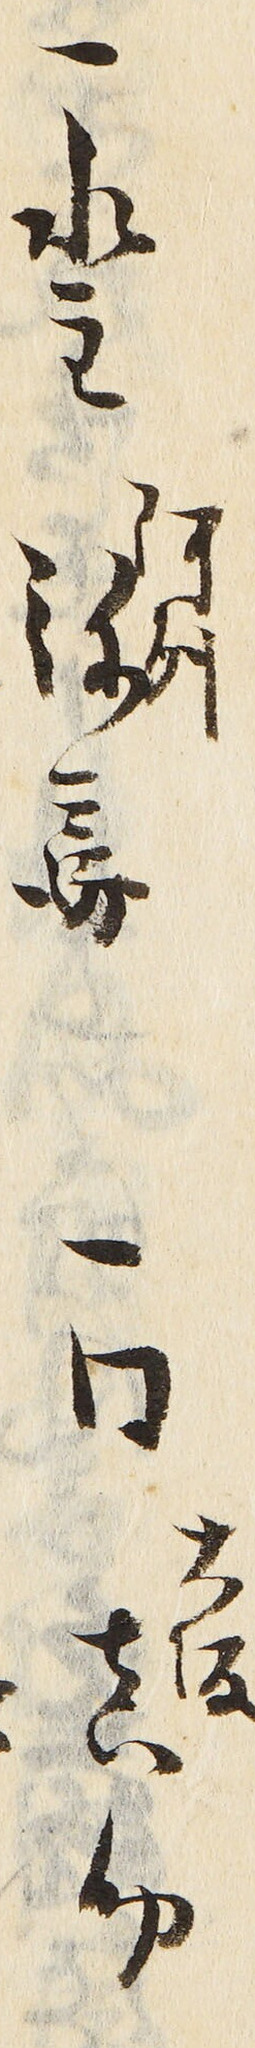一水主弥兵衛一同真助
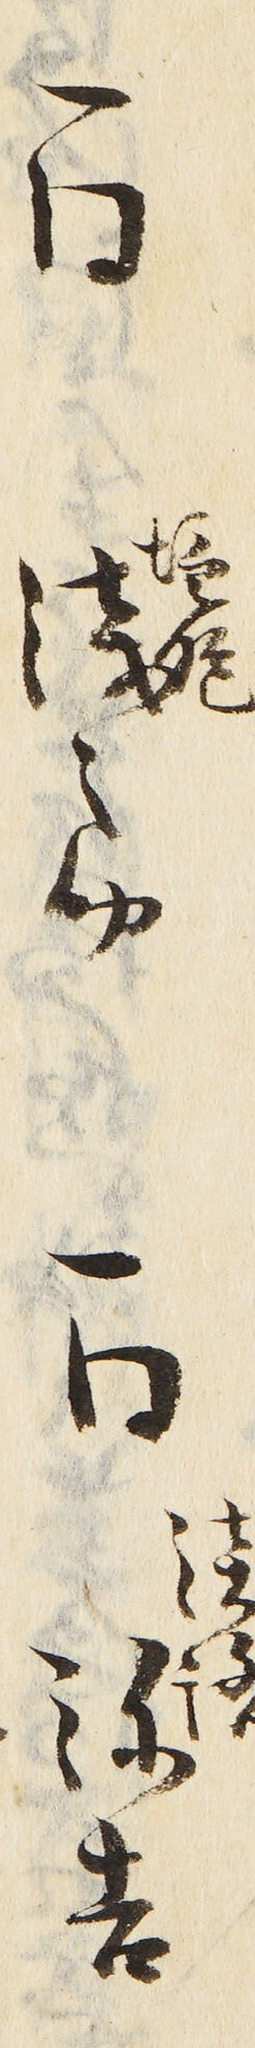一同浅之助一同弥吉
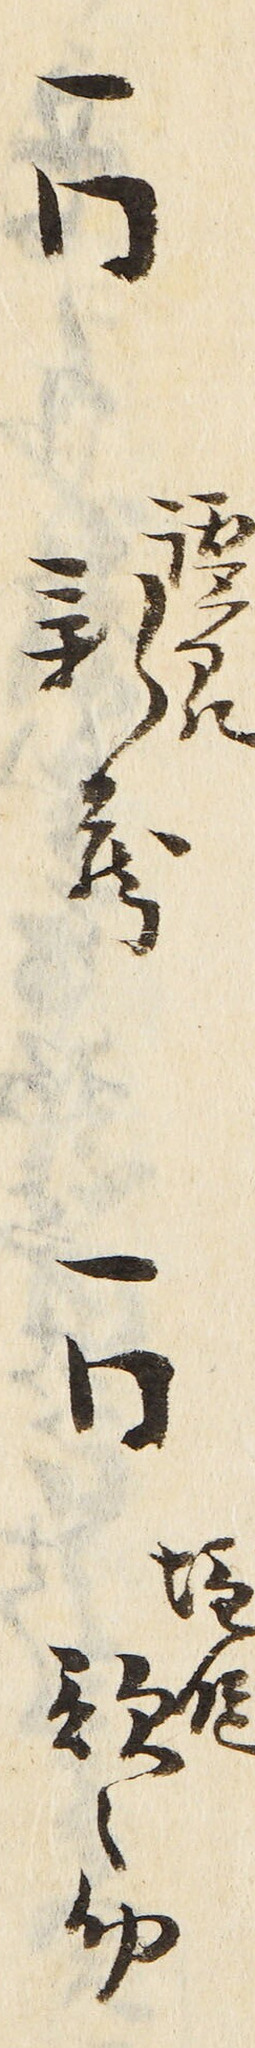一同新蔵一同歌之助
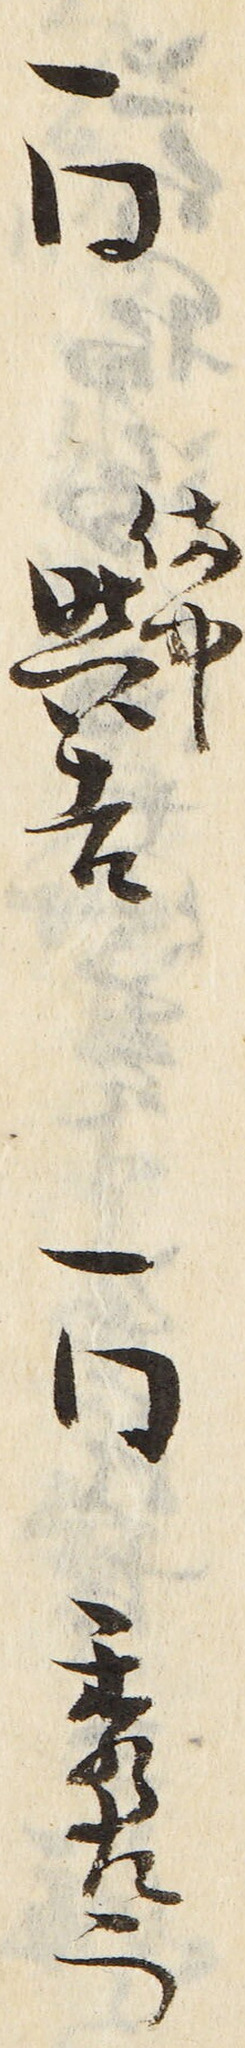一同與吉一同秀左衛門
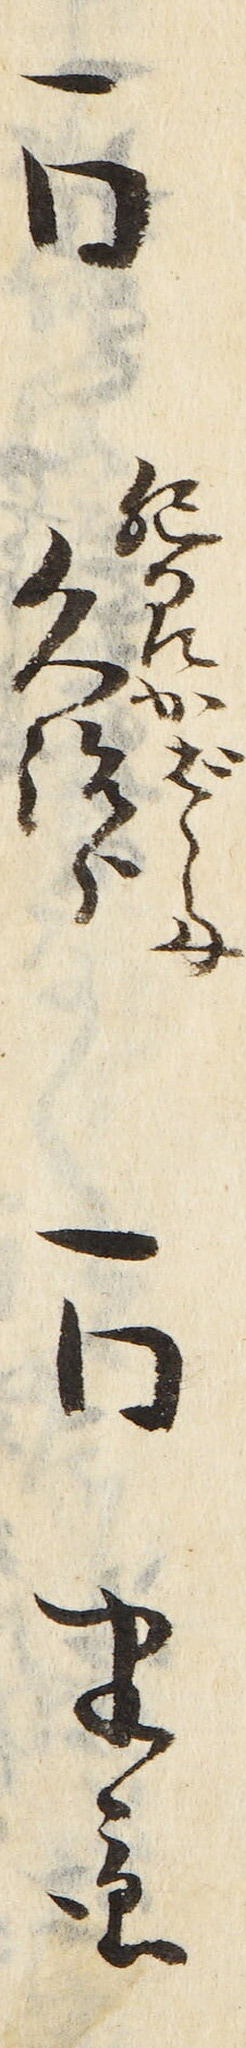一同久治郎一同半兵衛

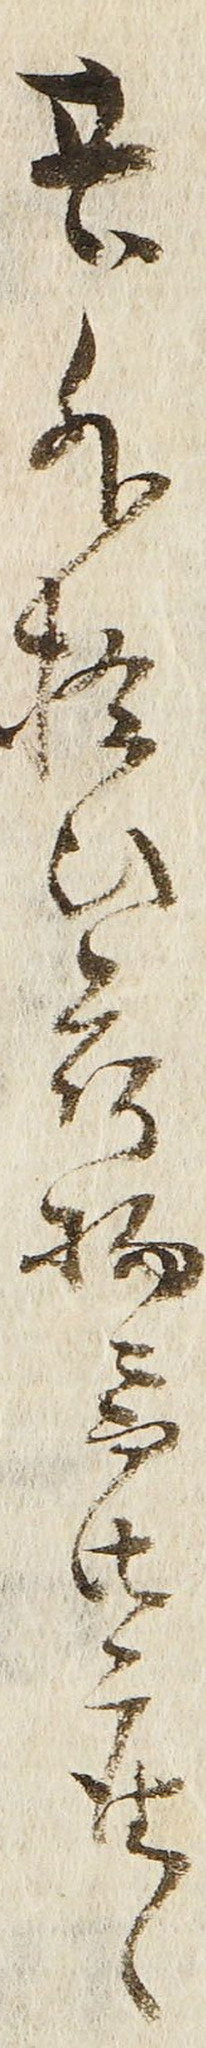其外拾ひ荷物ニ而御座候
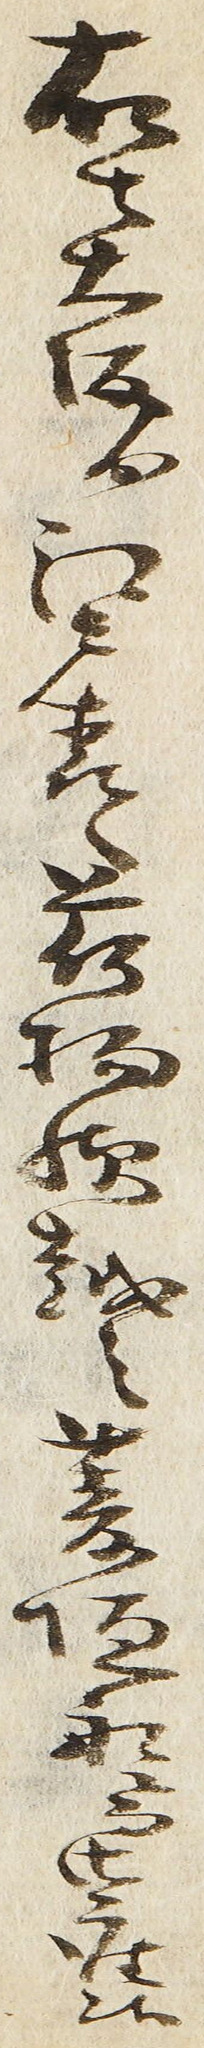右は大坂ゟ江戸表へ荷物積越之菱垣船ニ而御座候
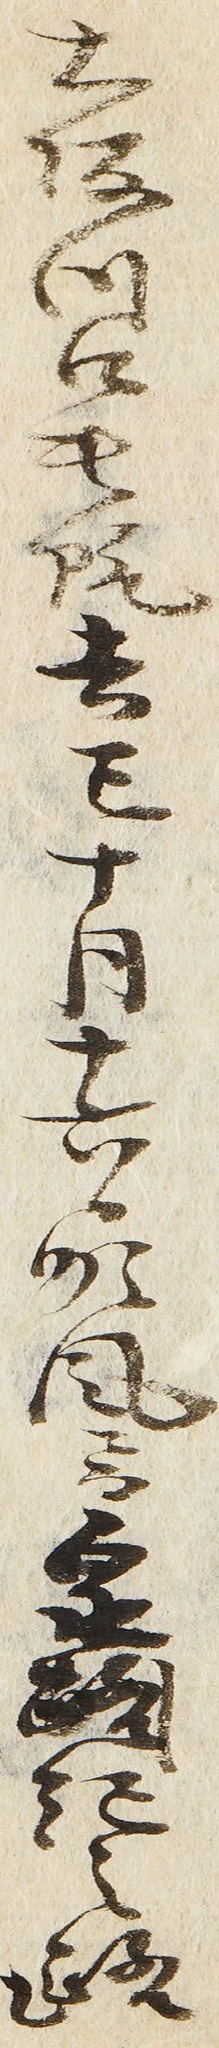大坂川口出帆去巳十月十六日順風ニ而泉路紀之路也
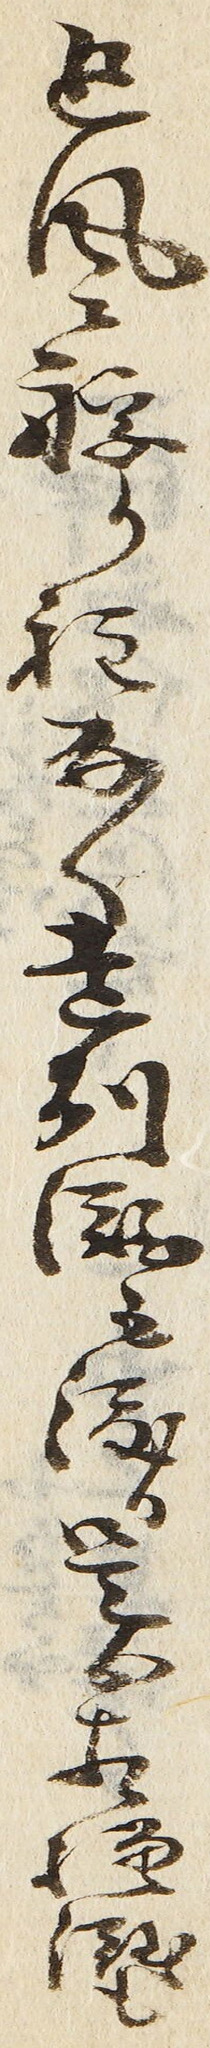追風ニ艀り程なく遠州灘も渡り是ゟ相模灘も
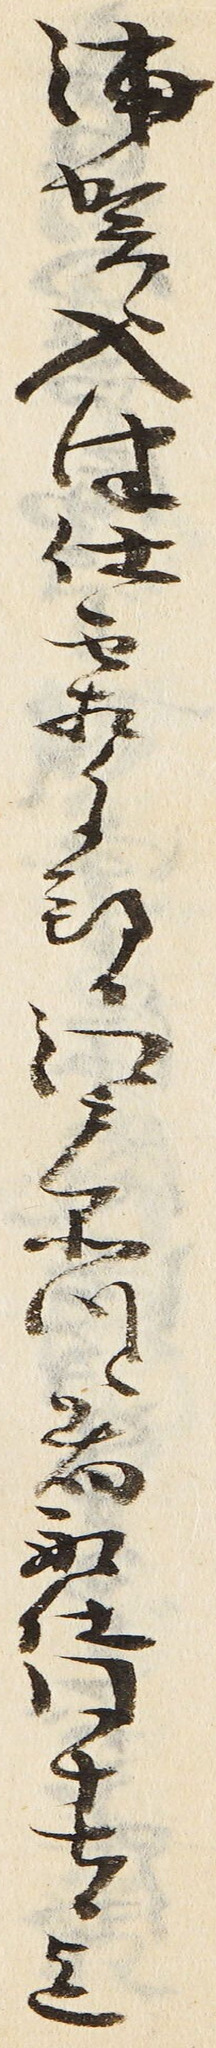浦賀へ入津仕霜月朔日江戸品川へ着船同十仕七日迄
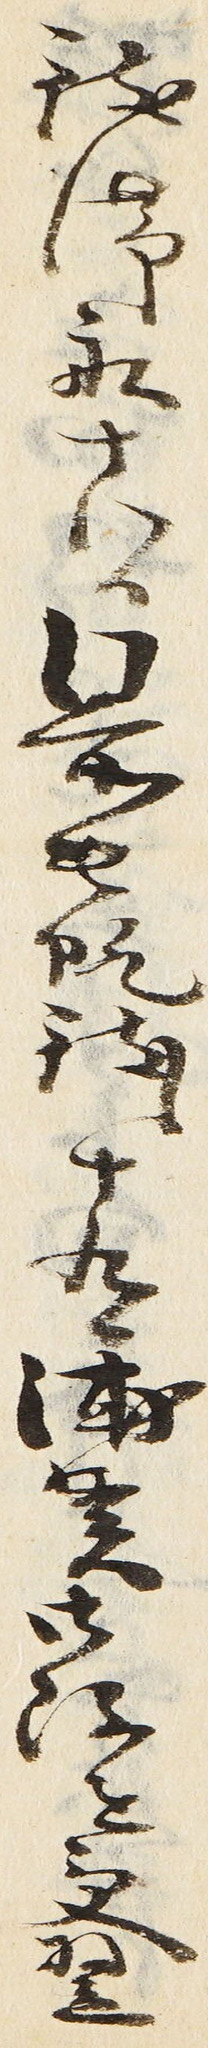致滞船十八日同所出帆致し十九日浦賀御改を受翌
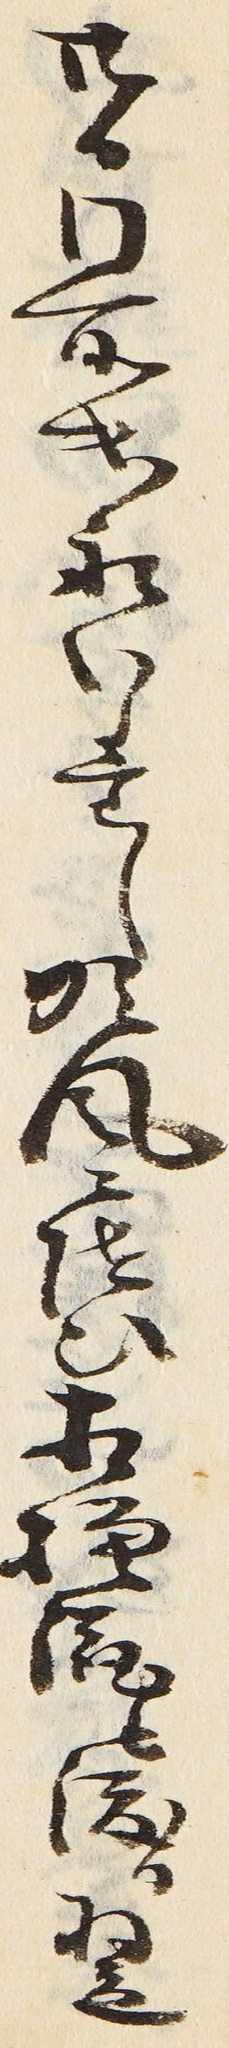廿日同所出船いたし順風ニ随ひ相模灘も渡り翌
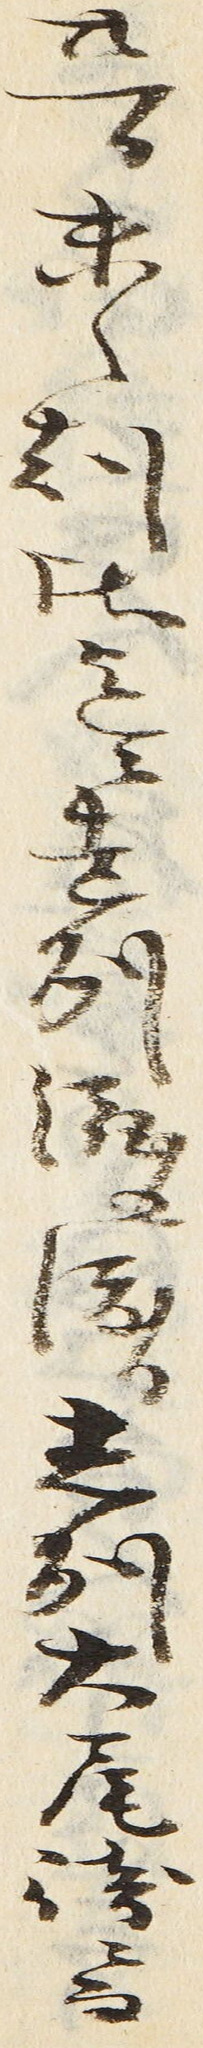廿一日未之刻頃迄ニ遠州灘も渡り志州大尾崎ニ而
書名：異国見聞記
